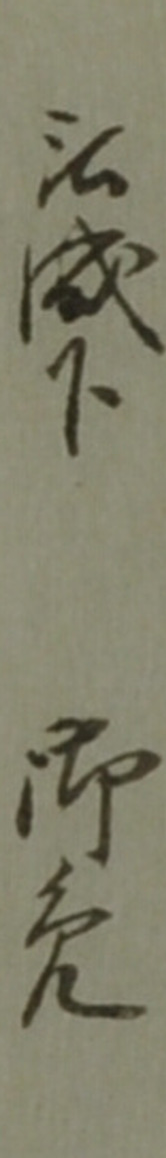被成下御免
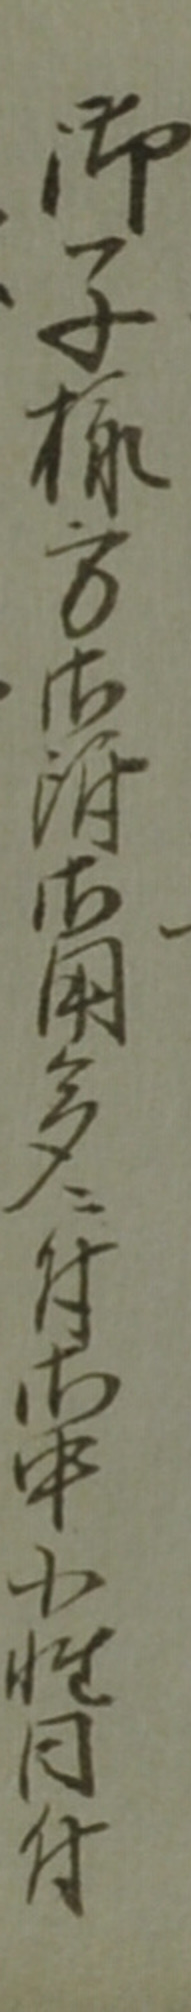御子様方御附御用多に付御中小性目付
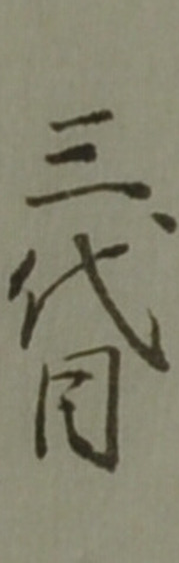三代目
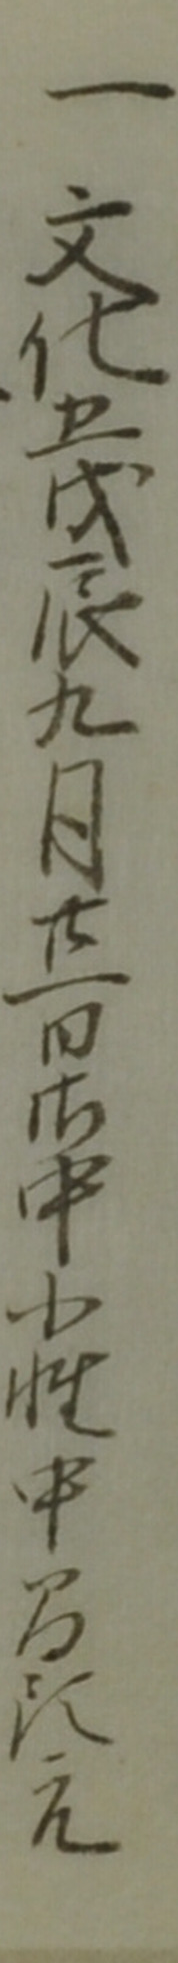一文化五戊辰九月廿一日御中小性中間頭元
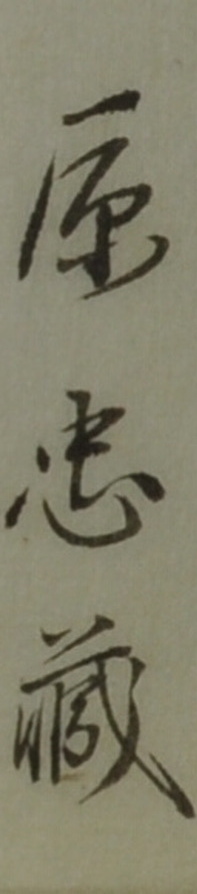原忠蔵
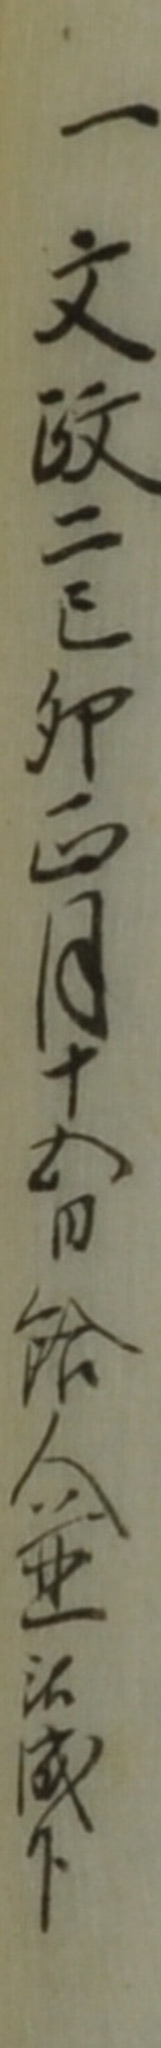一文政二己卯正月十五日給人並被成下
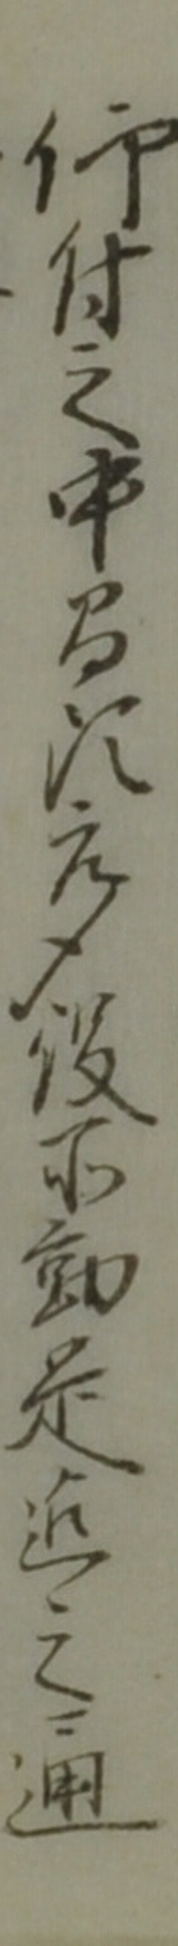仰付之中間頭元〆役所勤是迄之通
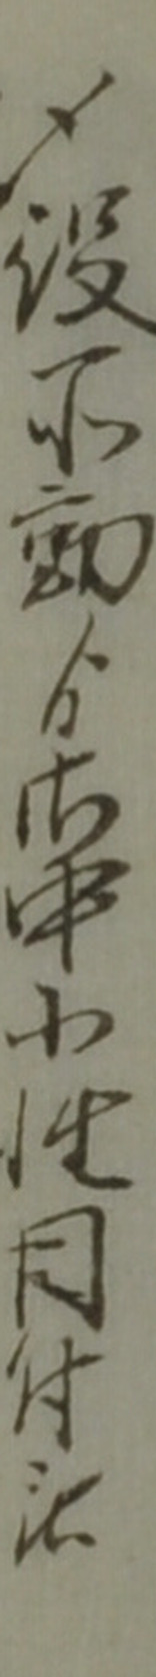〆役所勤より御中小性目付被
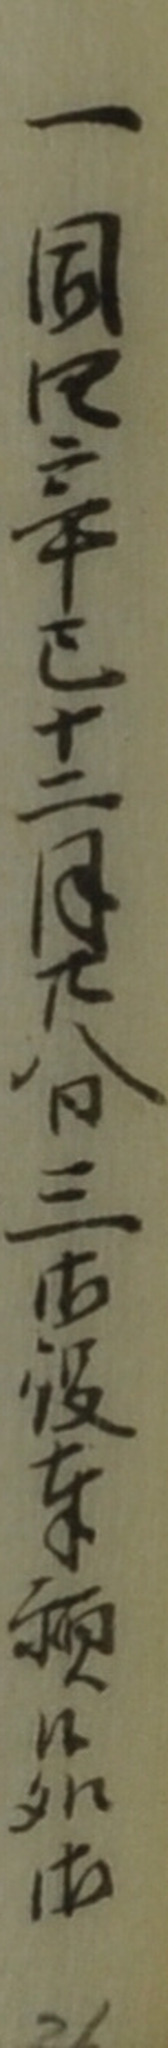一同四辛巳十二月廿八日三御役奉願候処御
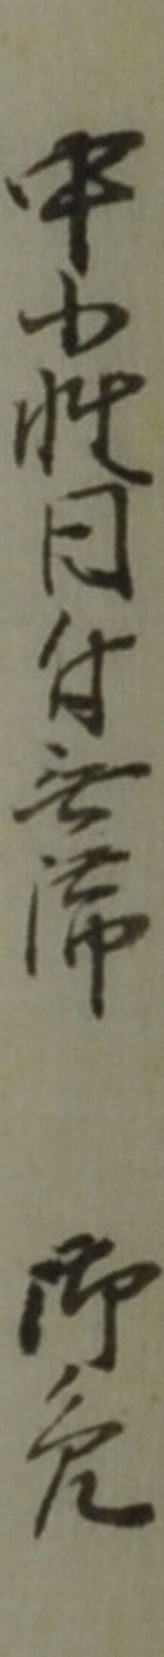御中小性目付無滞御免
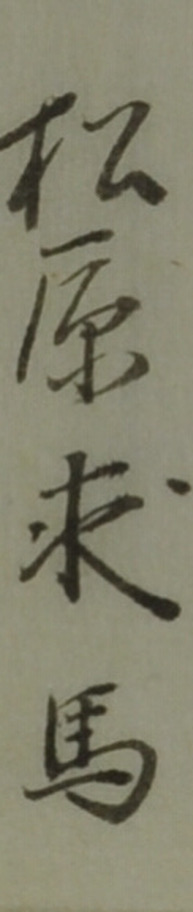松原求馬
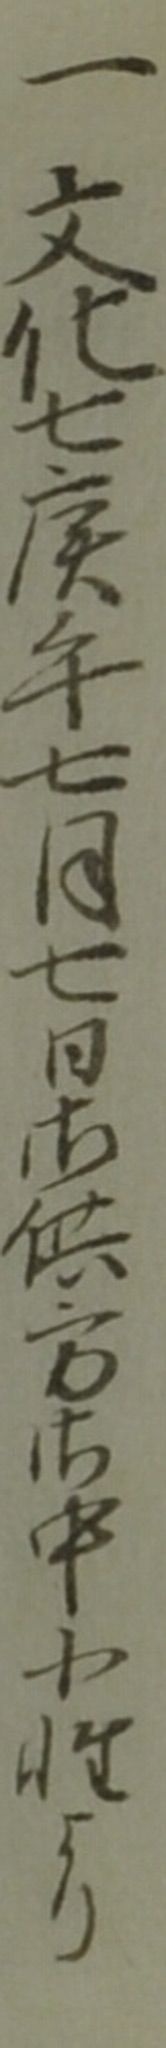一文化七庚午七月七日御供方御中小性より
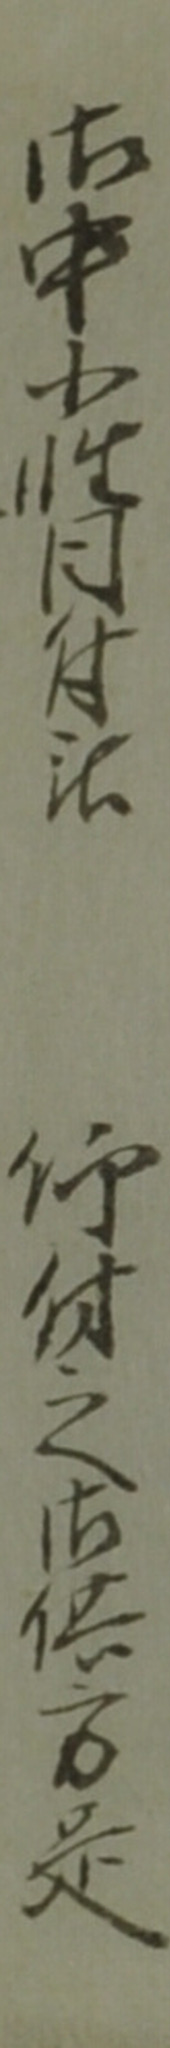御中小性目付被仰付之御供方是
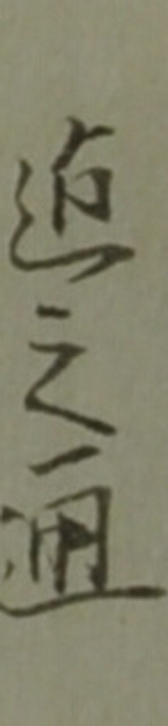迄之通
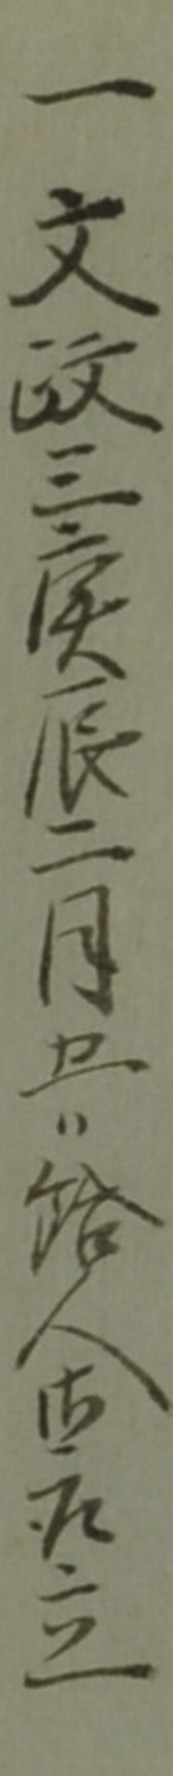一文政三庚辰二月五日給人御取立
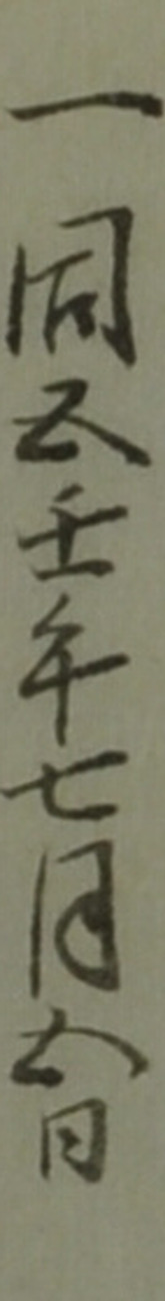一同五壬午七月五日
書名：諸御役代々録（八）
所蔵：伊那市立高遠町図書館・合同会社AMANE
